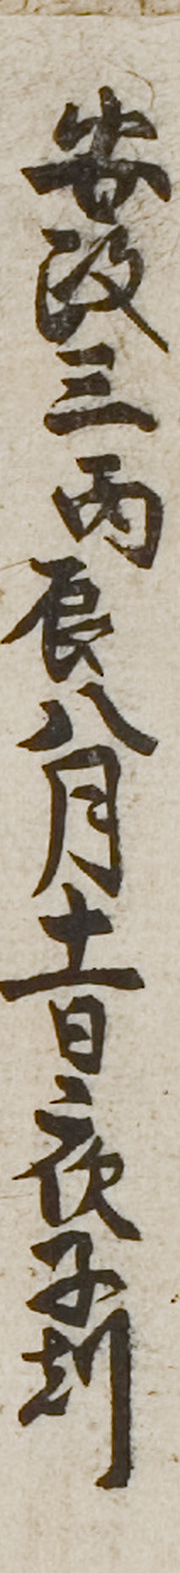安政三丙辰八月十一日夜子刻
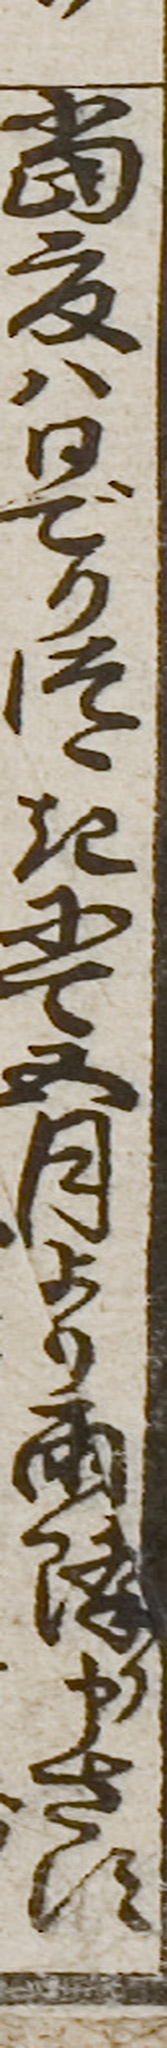当夏は日でりつゝきにて五月より雨降り申さす
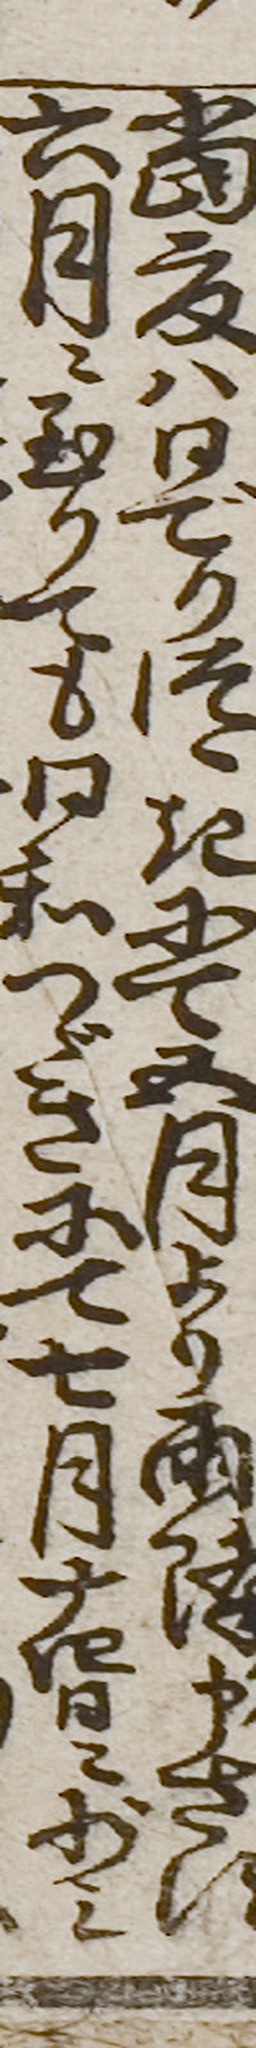六月に至りても日和つゞきにて七月十四日に少し
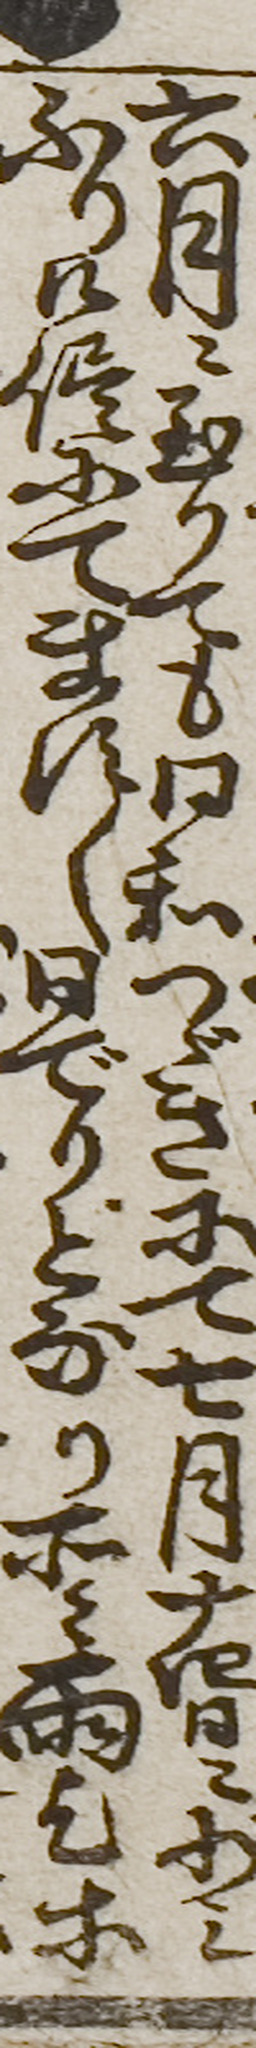ふり候侭にてます〳〵日でりとなり所々雨乞等
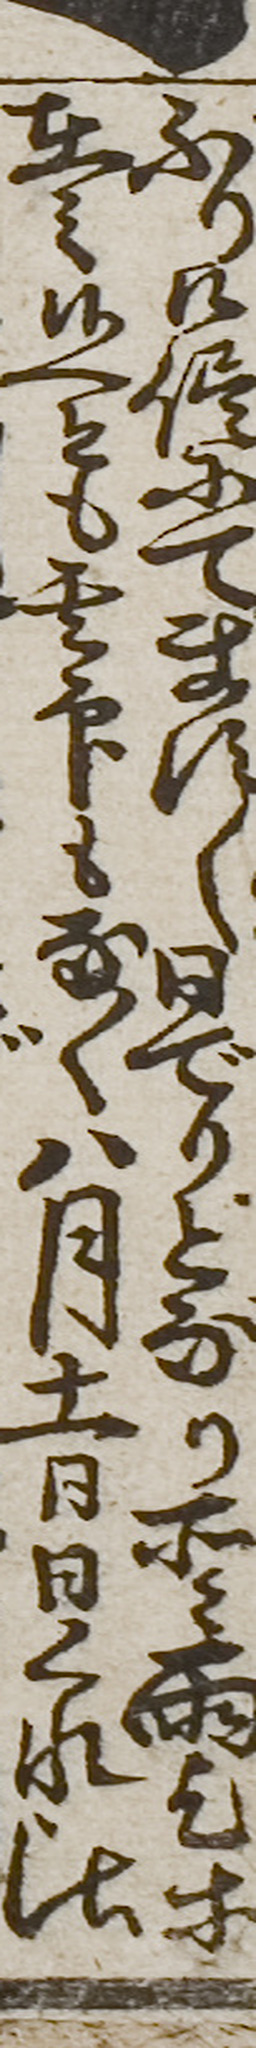在之候へとも其印もなく八月十一日日くれ頃
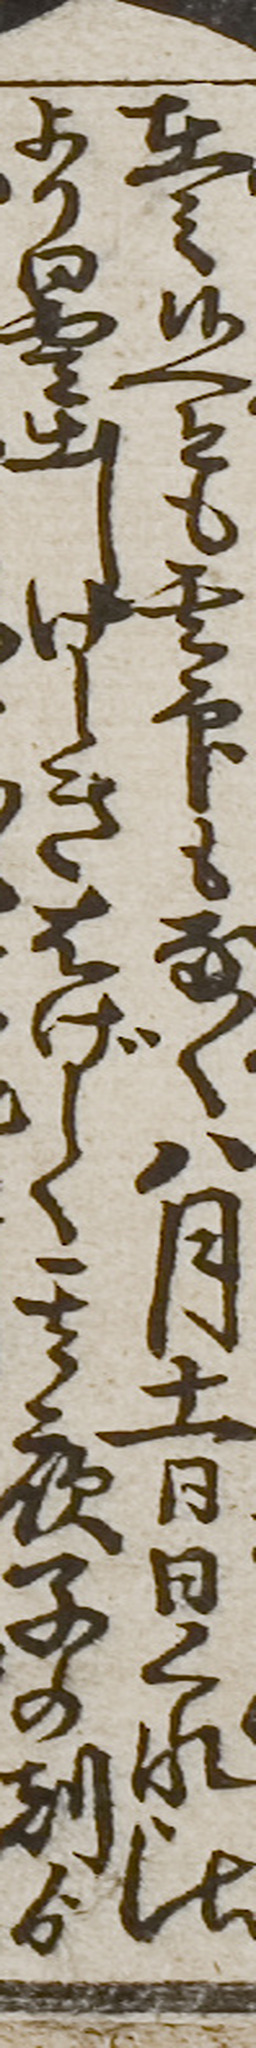より曇出しけしきはげしく其夜子の刻ゟ
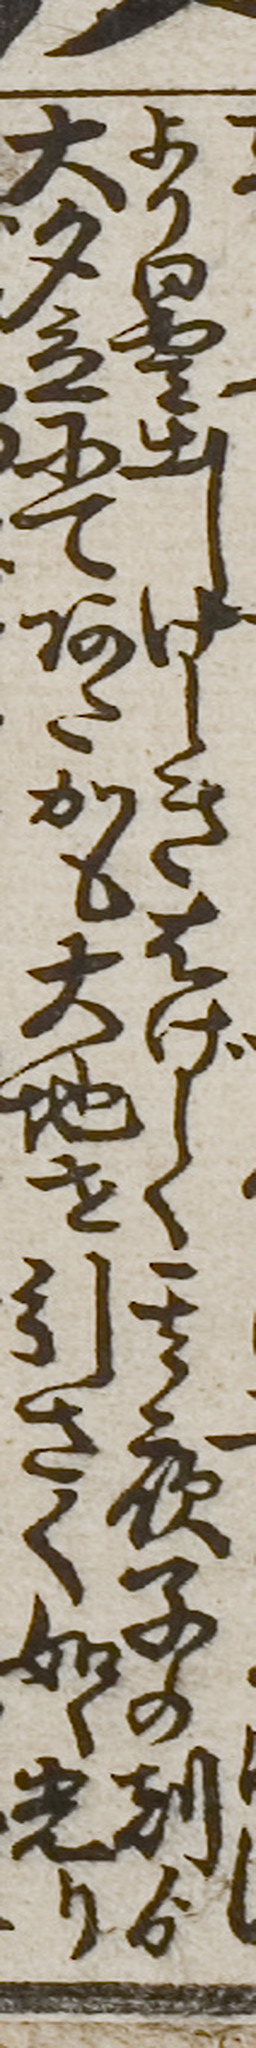大夕立にてあたかも大地を引さく如く光り
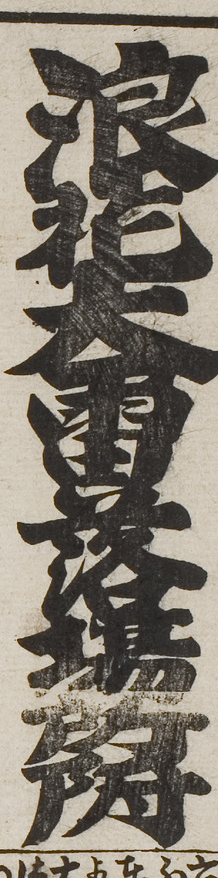浪花大雷落場所附
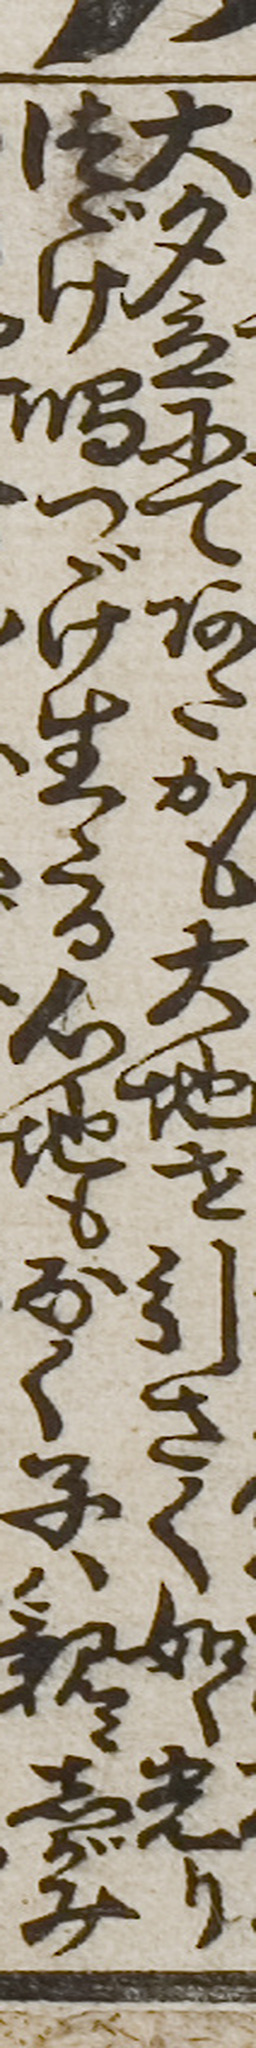つゞけ鳴つゞけ生たる心地もなく子は親にしがみ
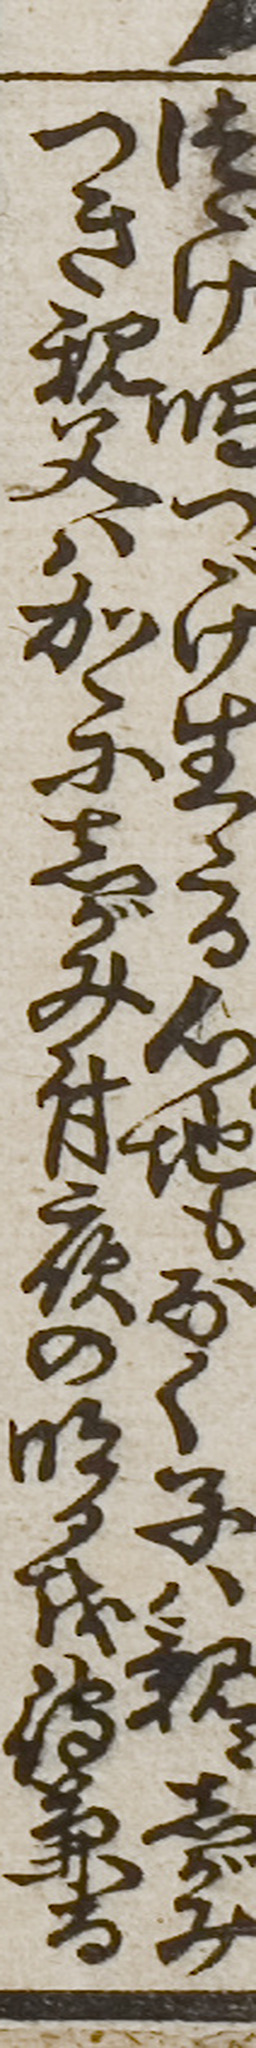つき親父はかゝにしがみ付夜の明るを待兼る
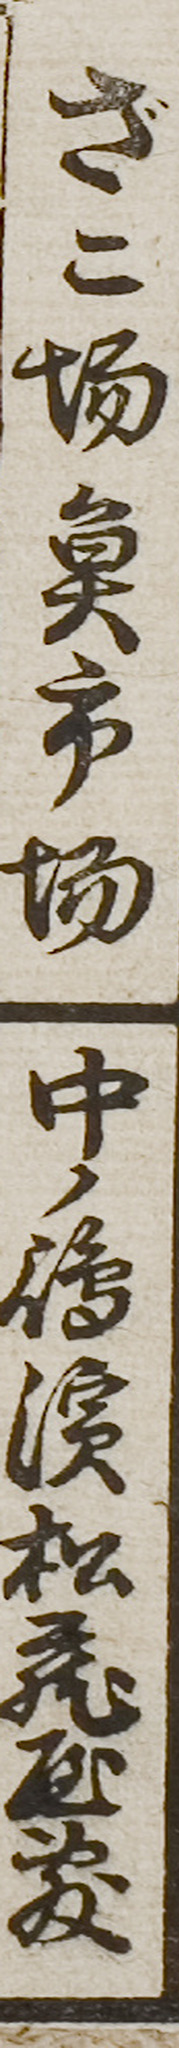ざこ場魚市場中の嶋浜松蔵屋敷
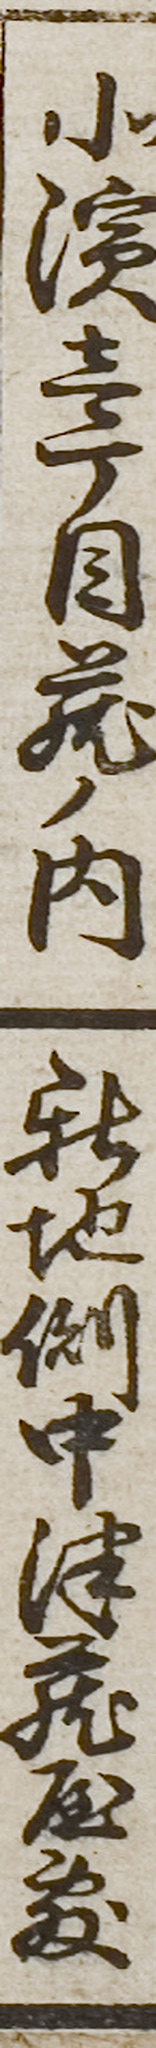北浜一丁目蔵の内新地側中津蔵屋敷
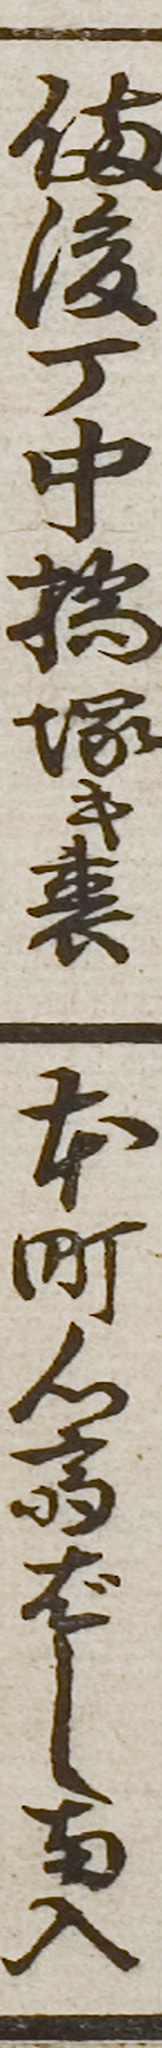備後丁中橋塚キ裏本町心斎ばし南入
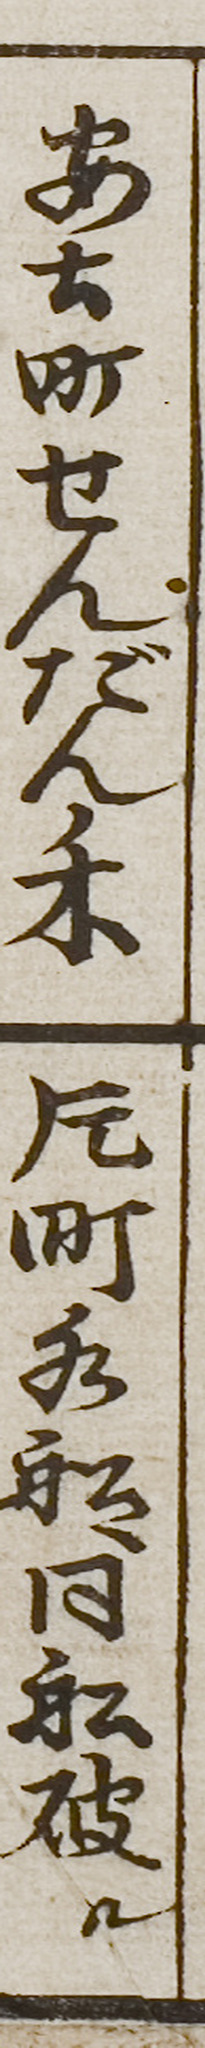安土町せんだんの木片町水船へ同船破る
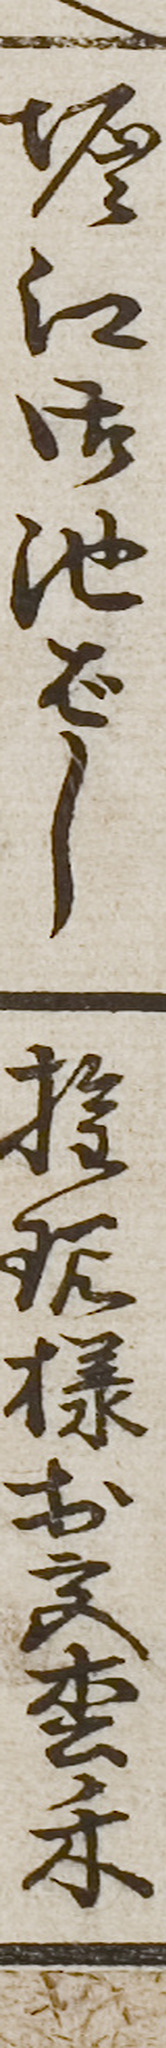堀江御池ばし権現様お宮松の木
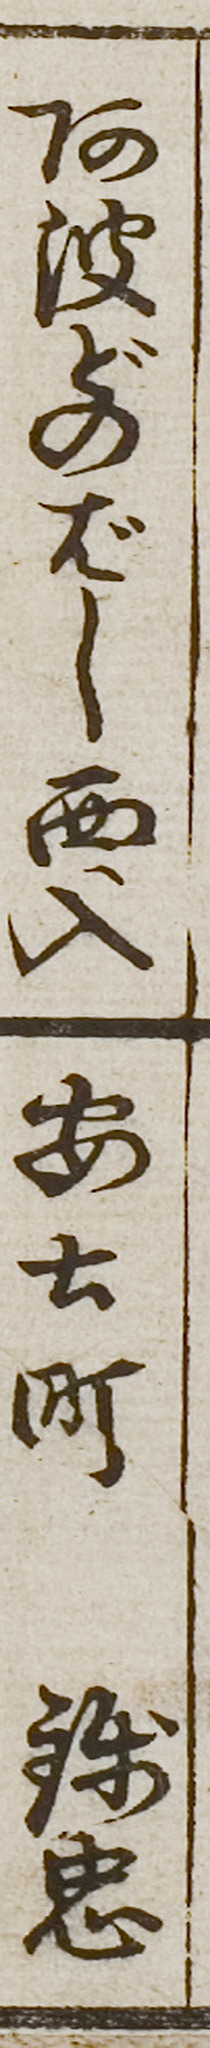阿波どのばし西入安土町銭忠
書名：浪花大雷落場所附
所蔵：東京大学総合図書館 General Library in the University of Tokyo, JAPAN
